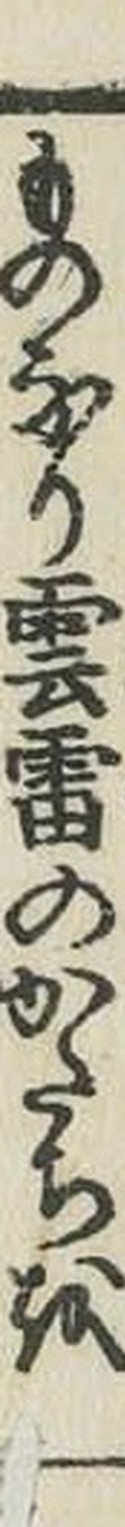ものなり雲雷のかたちを
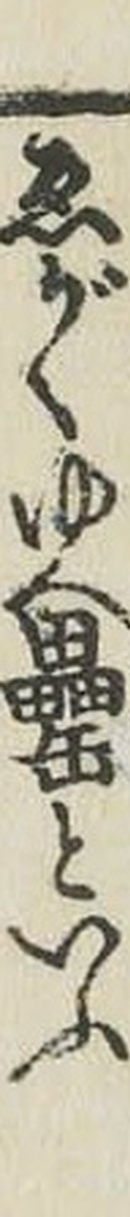ゑがくゆへ罍といふ
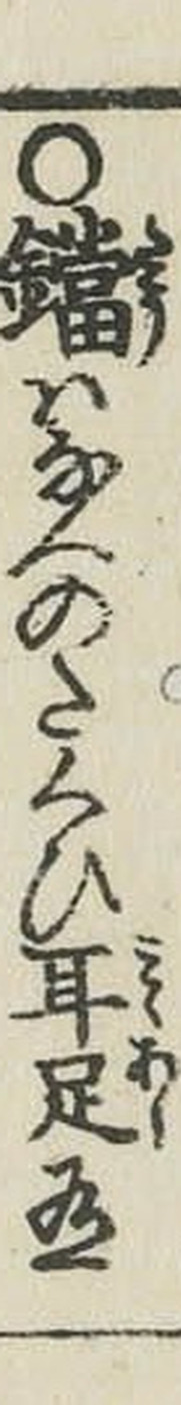○鐺はなへのたくひ耳足有
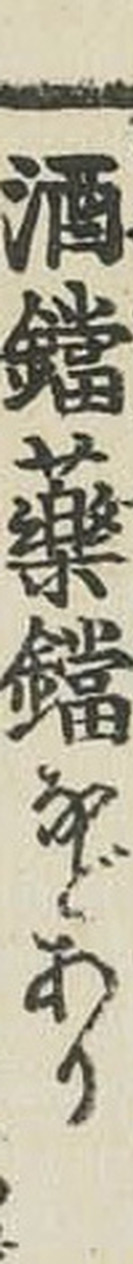酒鐺薬鐺などあり
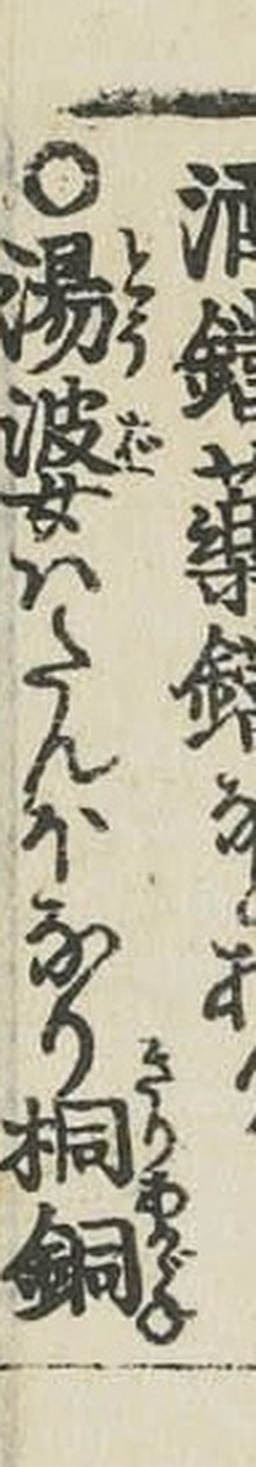○湯婆はたんほなり桐銅
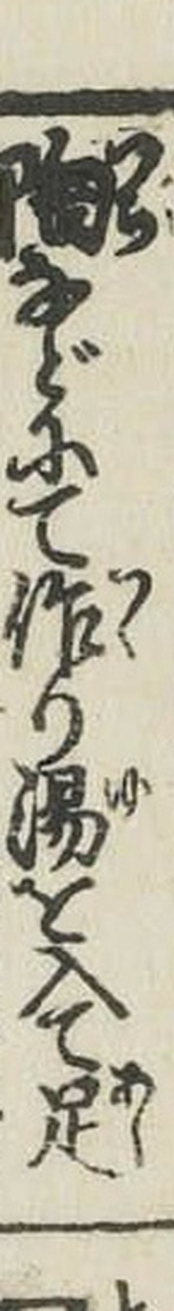陶などにて作り湯を入て足
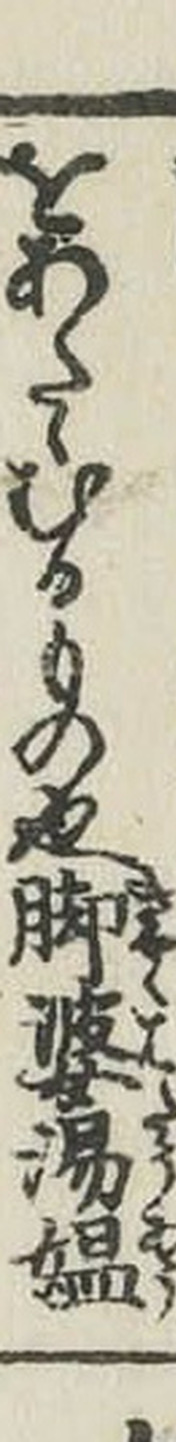をあたゝむるもの也脚婆湯媼
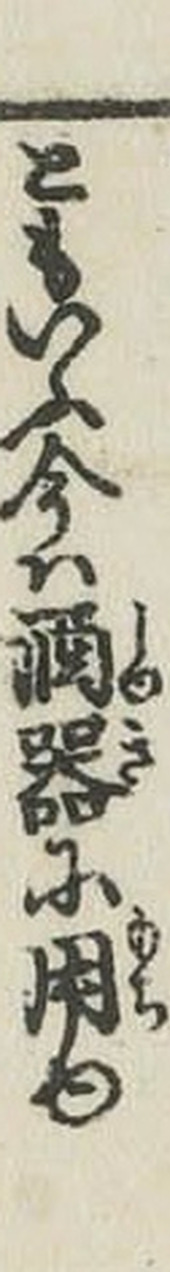ともいふ今は酒器に用ゆ
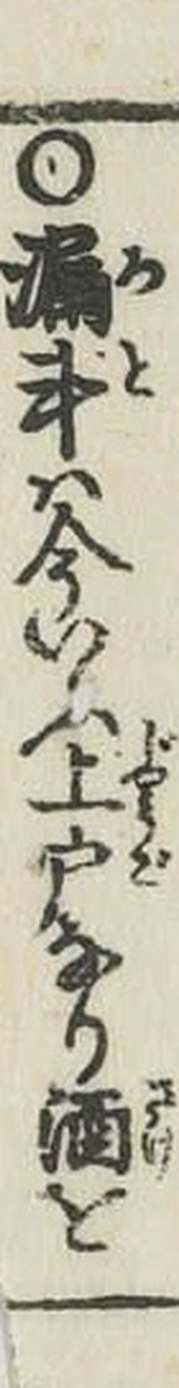○漏斗は今いふ上戸なり酒を
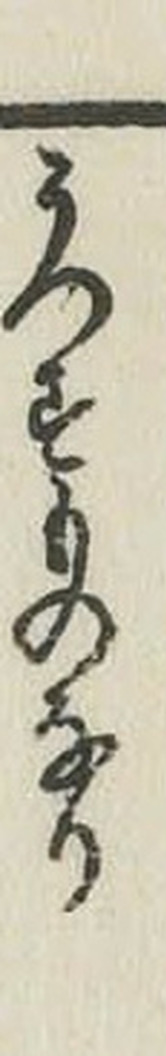うつすものなり
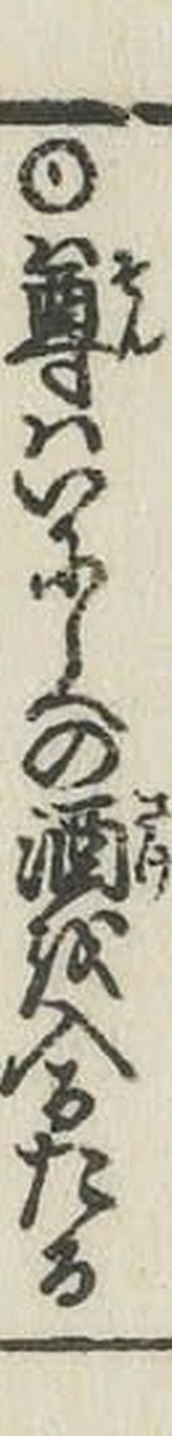○尊はいにしへの酒を入るたる
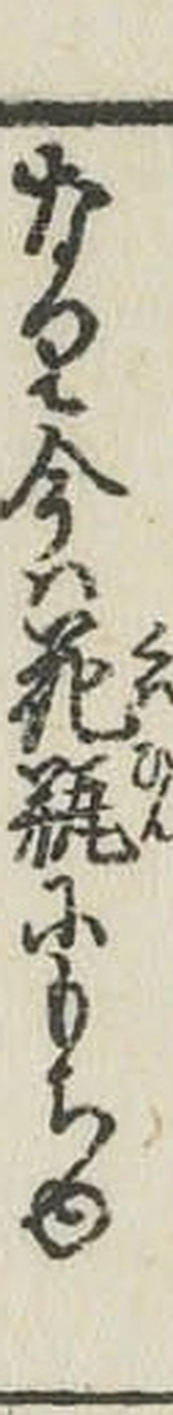なり今は花瓶にもちゆ
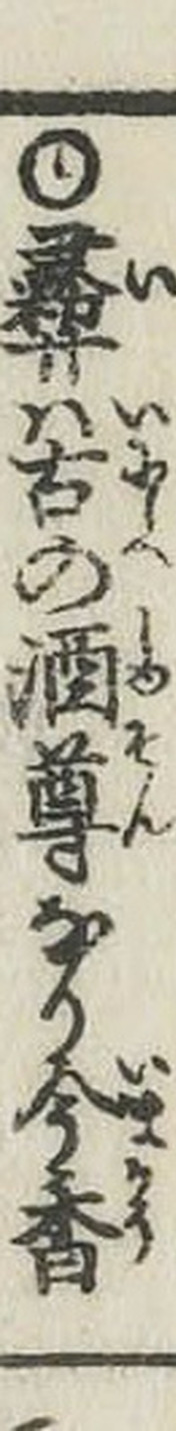○彛は古の酒尊なり今香
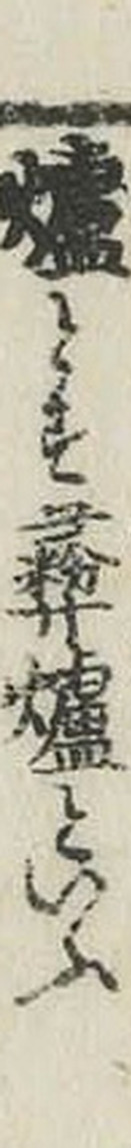炉とす彛炉といふ
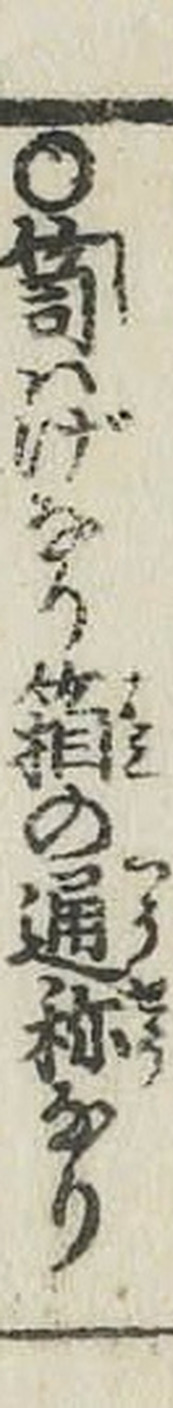○笥はげなり箱の通称なり
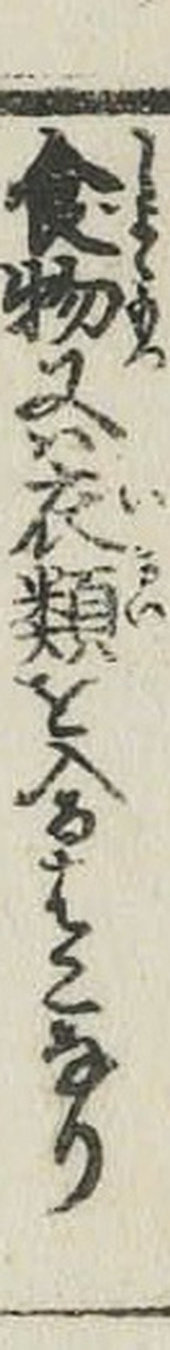食物又は衣類を入るはこなり
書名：増補頭書訓蒙図彙大成 10巻 5:巻之9-11
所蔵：東京学芸大学教育コンテンツアーカイブ
